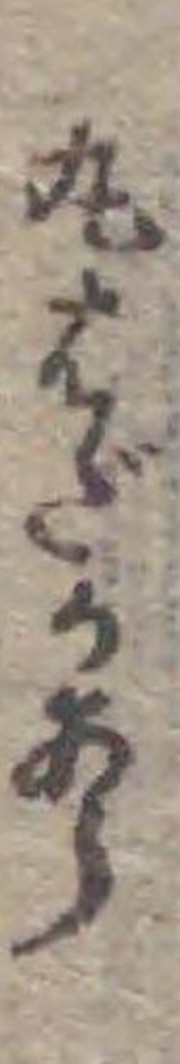丸はだかあら
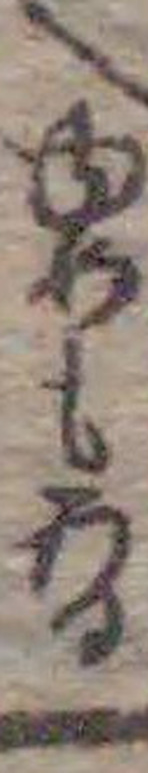ゆめもある
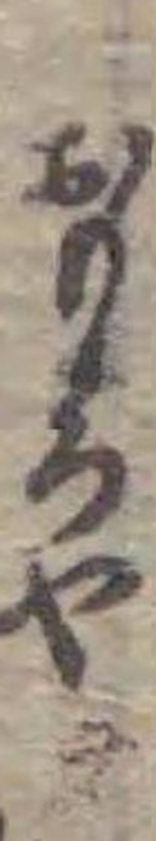おもしろや
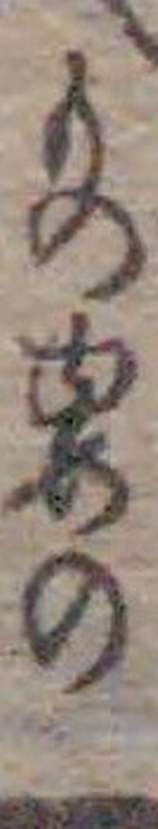ものゆめの
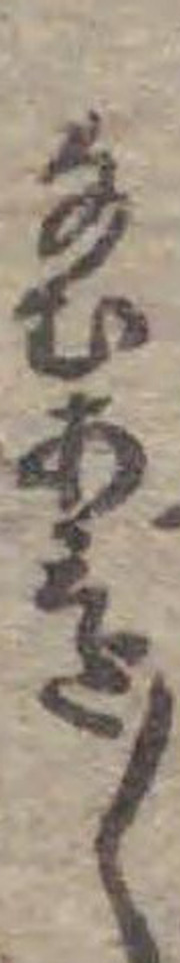なむあみだ〳〵
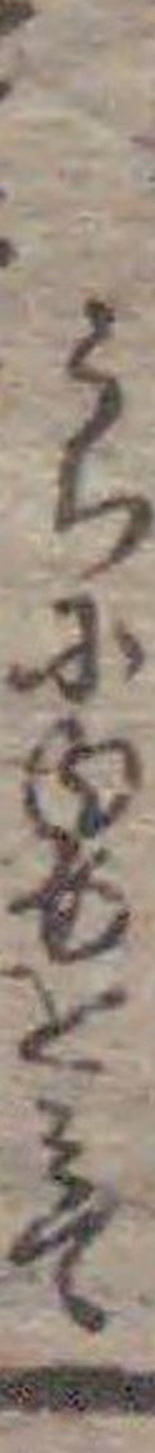うちにゆめをみて
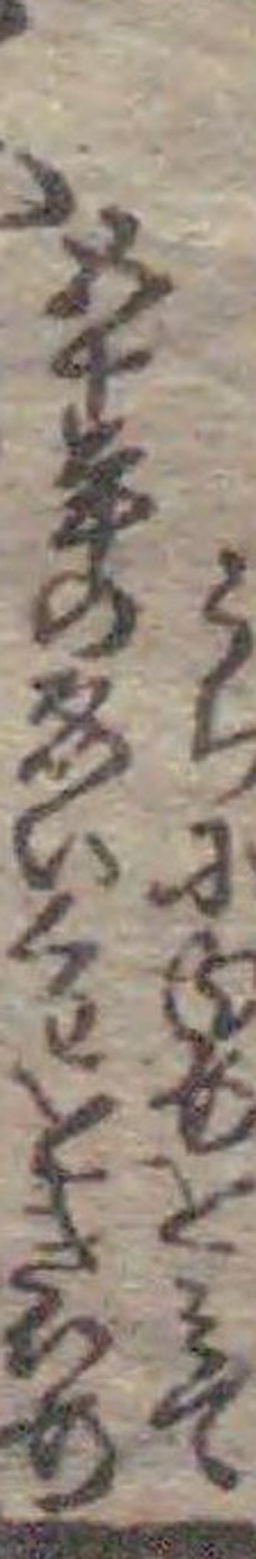五十年のゑいくわをきはめ
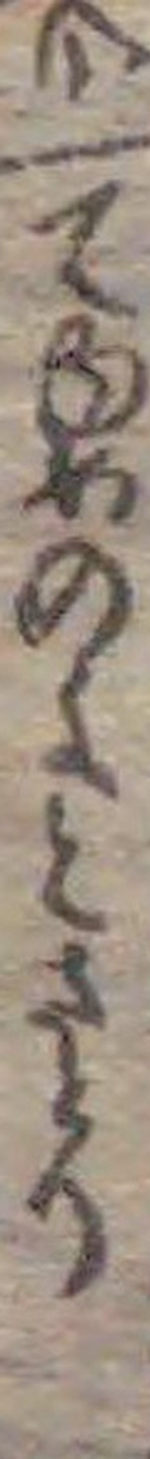てゆめのよとさとり
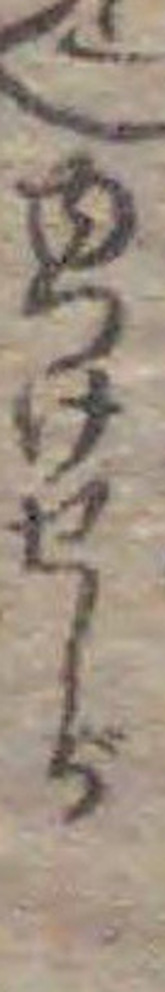ゆつけせしが
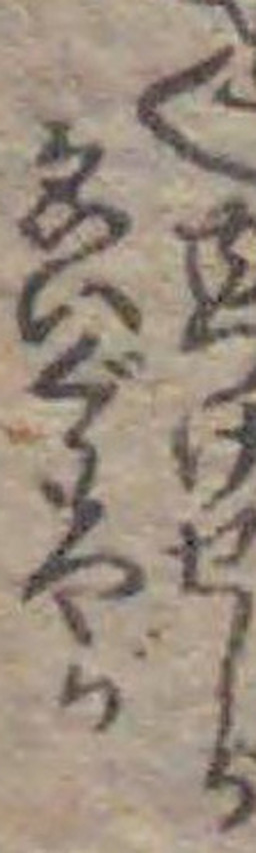ゑいぐわやが
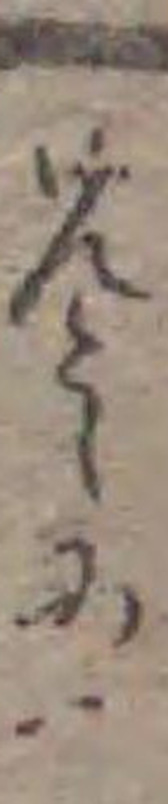んとしに❓
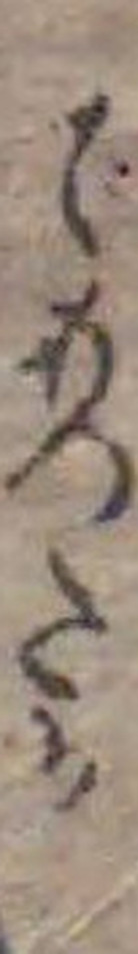であつたか
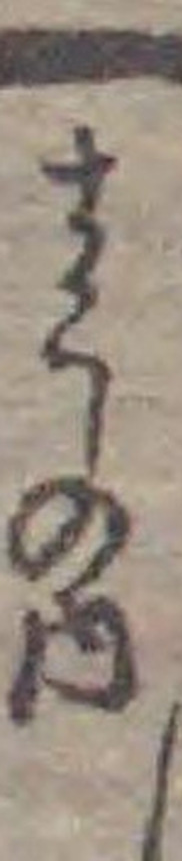すこしの内
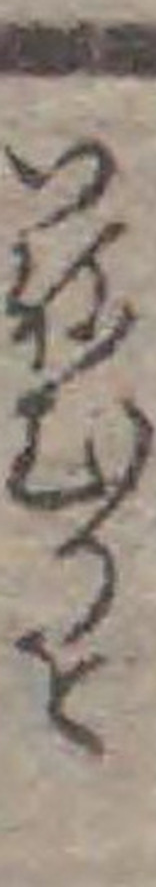いねむりを
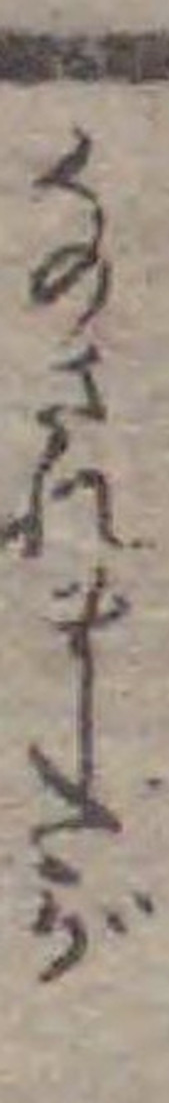なされましたが
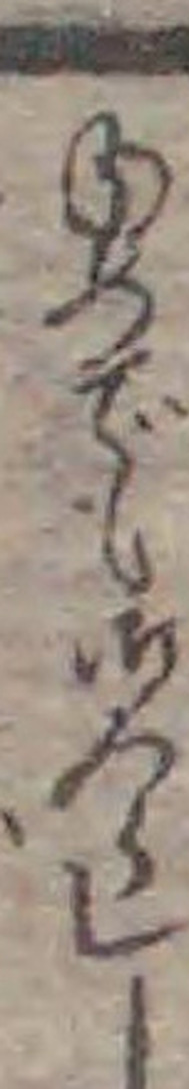ゆめでも御入らし
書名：見徳一炊夢 : 3巻
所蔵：国立国会図書館 National Diet Library, JAPAN
